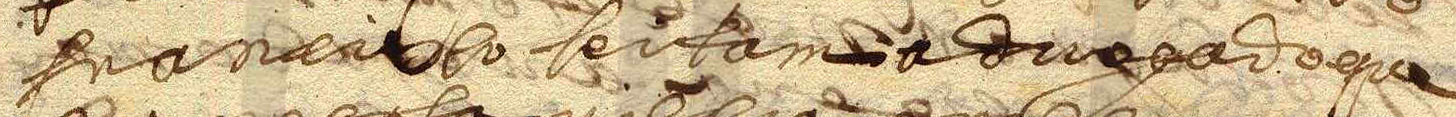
francisco leitam aduogado que
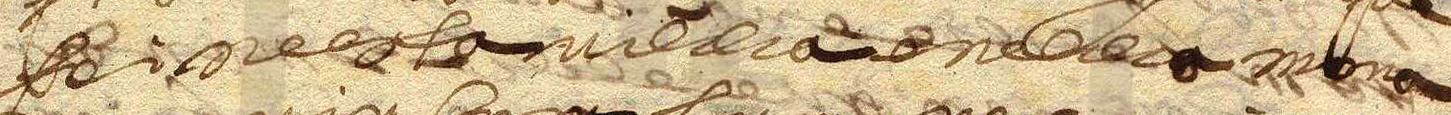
foi nesta uilla e nella mora
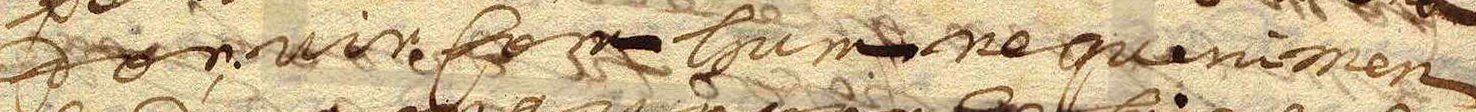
dor, uir Com hum requerimen
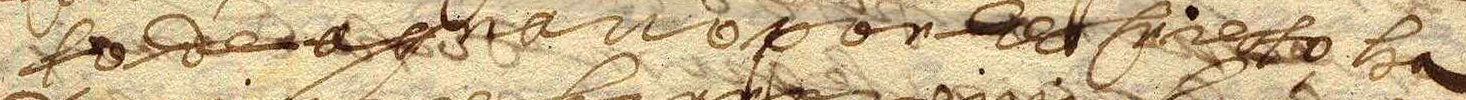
to de agrauo por EsCristo ha
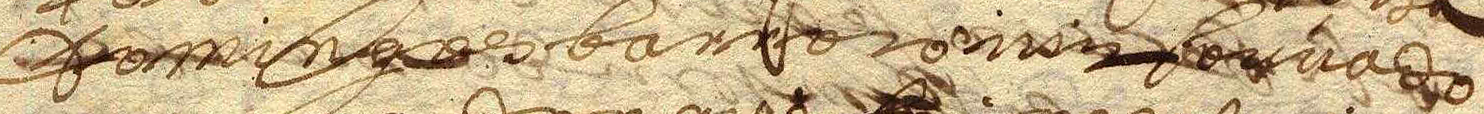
Domingos barrozo iuiz louuado
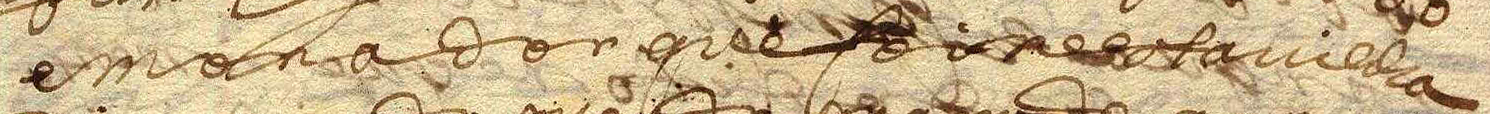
e morador que foi nesta uilla
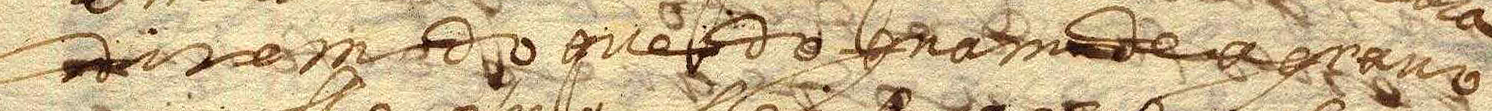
dizemdo que do gramde agrauo
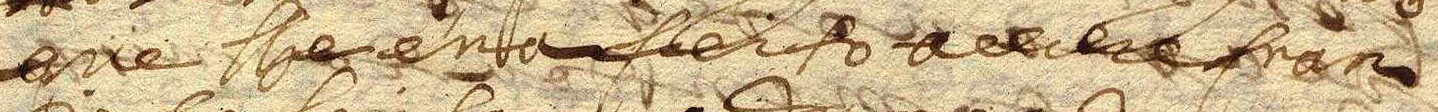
que lhe era feito a elle fran
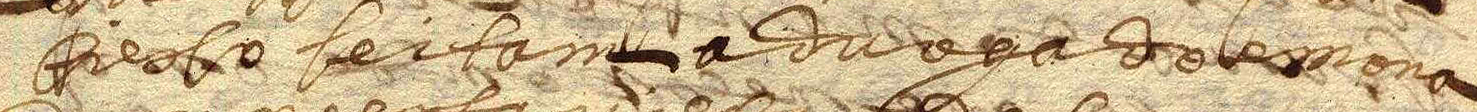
cisco leitam aduogado e mora
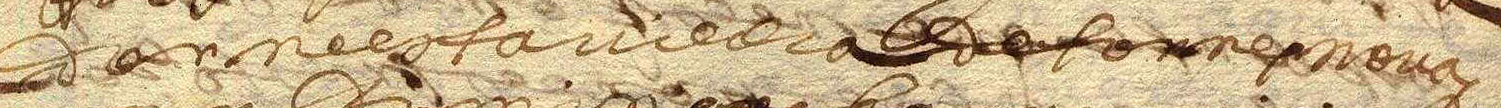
dor nesta uilla de torres nouas
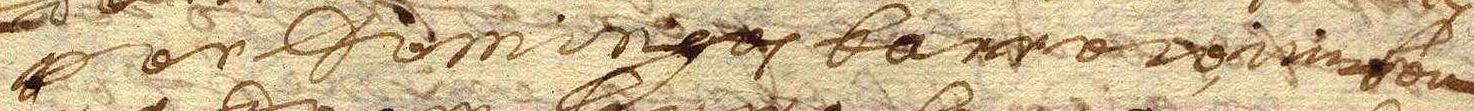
por Domingos barrozo, iuiz lou
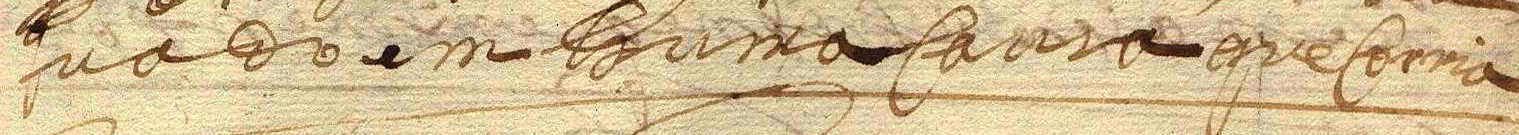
uado em huma Cauza que Corria
